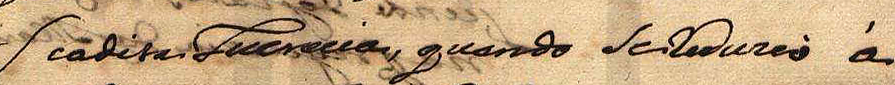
Se a dita Lucrecia, quando se Reduzio á
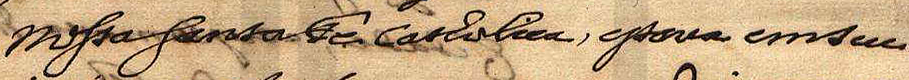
nossa Santa Fé catholica, estava em seu
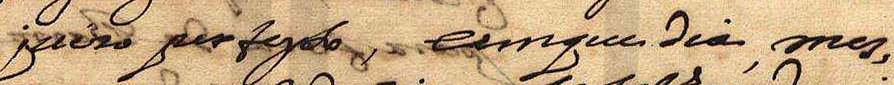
juizo perfeyto, e em que dia, mes,
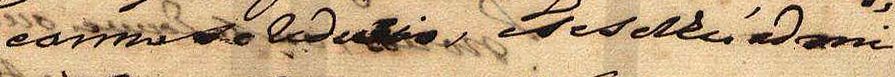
e anno se Reduzio, e se se lhe admi
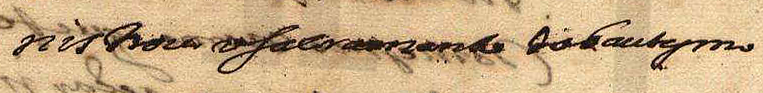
nistrou o sacramento de bautismo
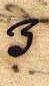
3
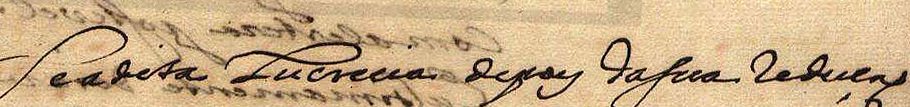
Se a dita Lucrecia depois da sua Reduçaõ
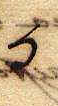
5.
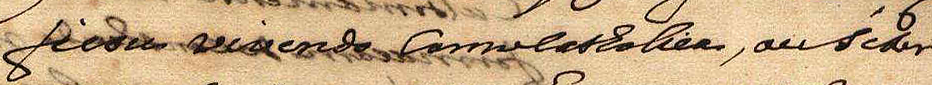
ficou vivendo como catholica, ou se tor
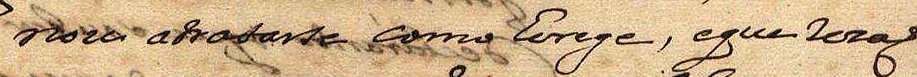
nou a tratarse como herege, e que Rezaõ
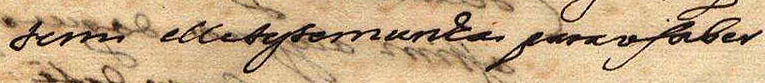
tem elle testemunha para o saber
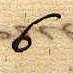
6
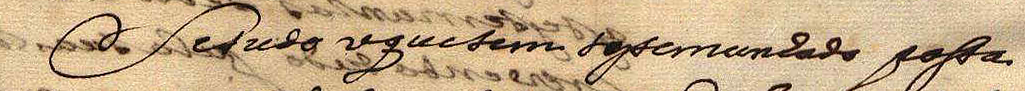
Se tudo o que tem testemunhado passa
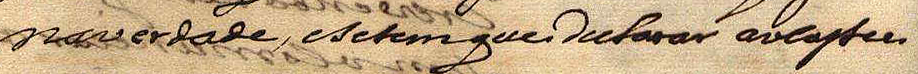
na verdade, e se tem que declarar ao costu
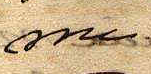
me
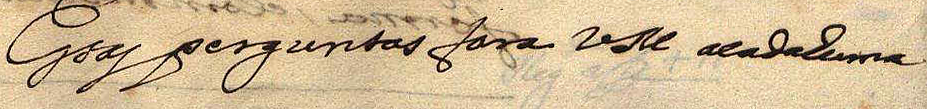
Estas perguntas fara VM a cada huma
